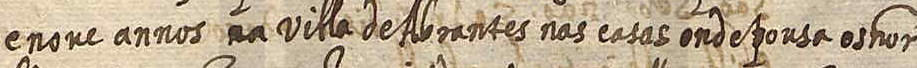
e noue annos na villa de Abrantes nas casas onde pousa o sn̄or
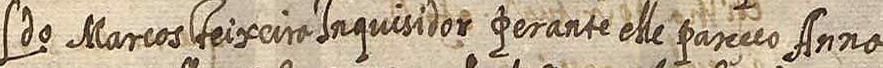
Ldo. Marcos Teixeira Inquisidor perante elle pareçeo Anna
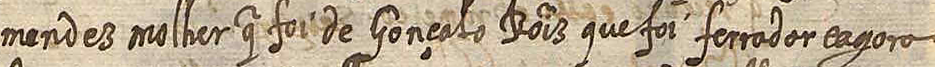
mendez molher q̄ foi de Gonçalo Roīz que foi ferrador e agora
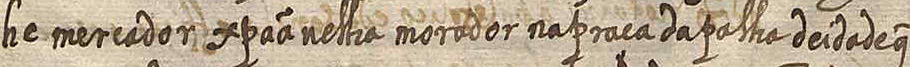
he mercador xpaã uelha morador na praça da palha de idade q̄
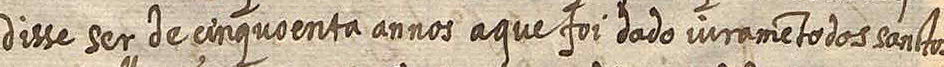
disse ser de çinquoenta annos a que foi dado iuramēto dos sanctos
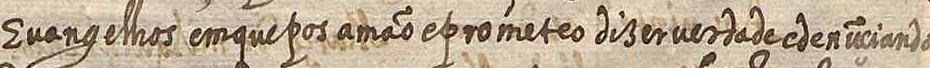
Euangelhos em que pos a mão e prometeo dizer uerdade e denūçiando
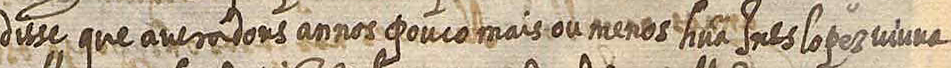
disse que auera dous annos pouco mais ou menos hua Jnes lopez viuua
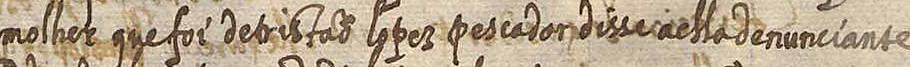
molher que foi de tristão lopez pescador disse a ella denunciante
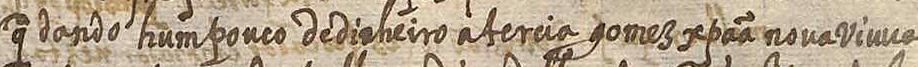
q̄ dando hum pouco de dinheiro a tereia gomez xpãa noua viuua
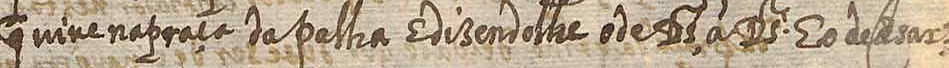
q̄ uiue na praça da palha E dizendolhe o de Ds̄ a Ds̄ E o de Cæsar
